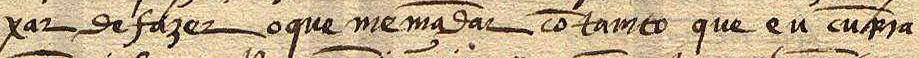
xar de fazer o que me mādar c̄otamto que eu cūpra
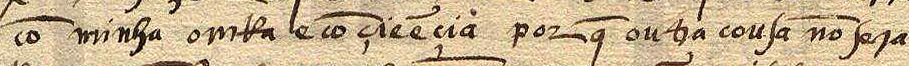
c̄o minha omRa e c̄ociēcia porq̄ outra cousa nō sera
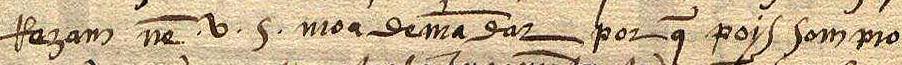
Rezam n̄e .V. s. mo a de m̄adar por q̄ poys som pro
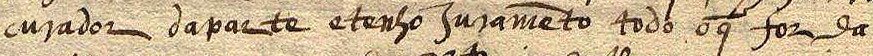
curador da parte e tenho Juramēto todo o q̄ for da
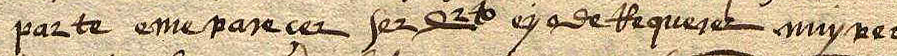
parte e me parecer ser drto ey o de Requerer muy per
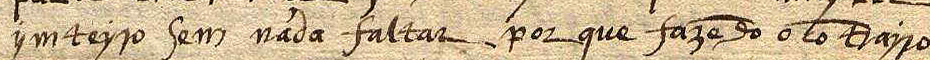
ymteyro sem nada faltar por que faz̄edo o c̄otrayro
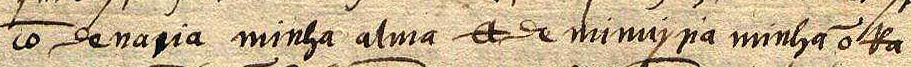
c̄odenaria minha alma Et de minuyria minha ōRa
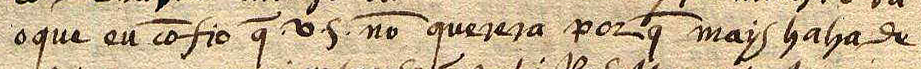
o que eu c̄ofio q̄ v. s. nō querera porq̄ mays ha ha de
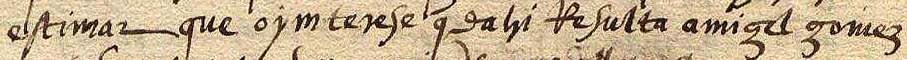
estimar que o ymterese q̄ dahi Resulta a migel gomez
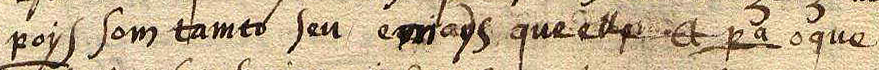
poys som tamto seu e mays que elle Et ꝑa o que
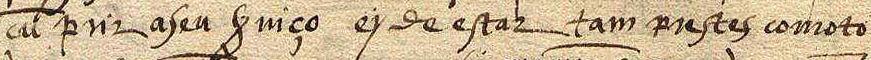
cūprir a seu ꞩuiço ey de estar tam prestes como to
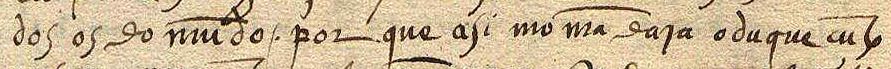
dos os do mūdo /. porque asi mo m̄adara o duque cuJo
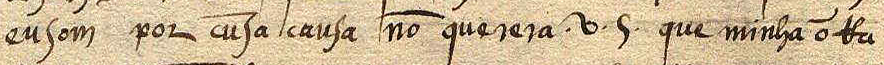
eu som por cuJa causa n̄o querera .V. s. que minha ōRa
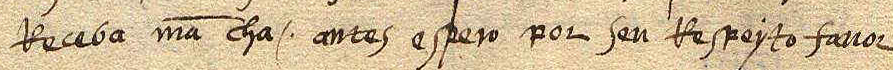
Receba mācha /. antes espero por seu Respeyto fauor
